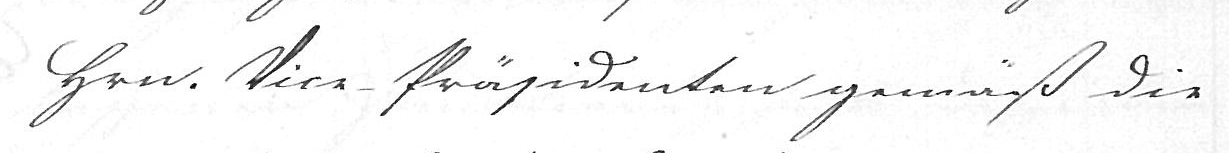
Hrn. Vice-Präsidenten gemäß die
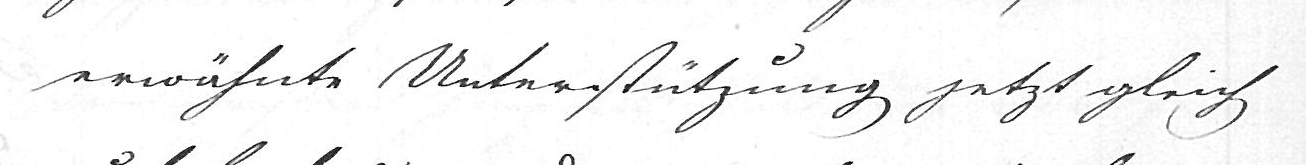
erwähnte Unterstützung jetzt gleich
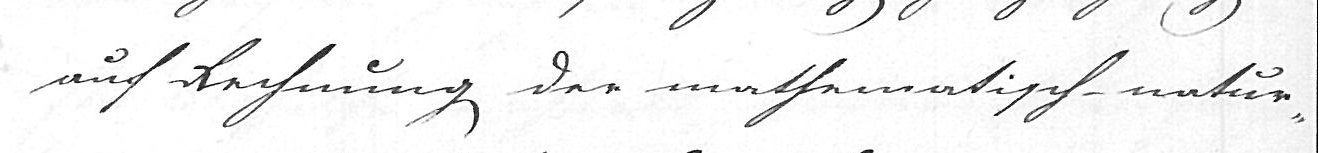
auf Rechnung der mathematisch-natur-
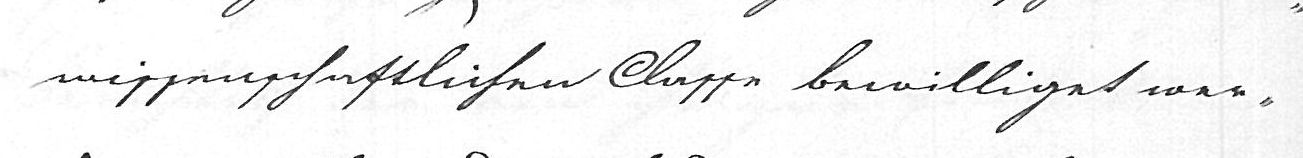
wissenschaftlichen Classe bewilliget wer-
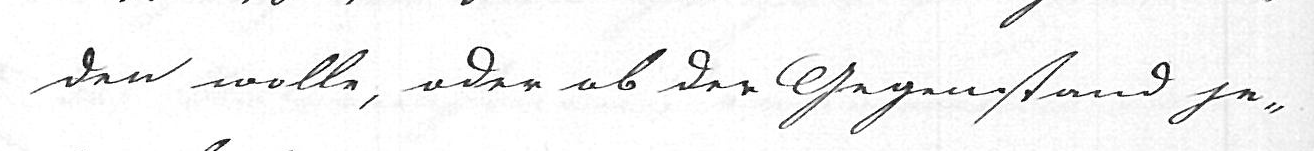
den wolle, oder ob der Gegenstand je-
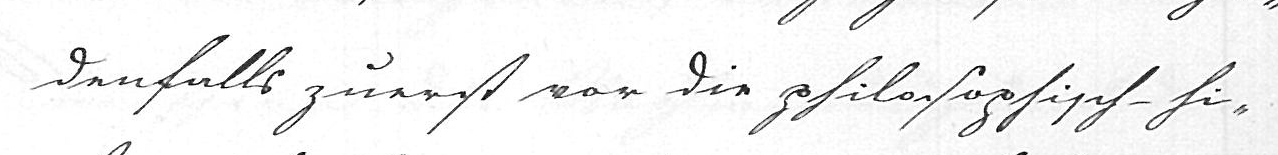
denfalls zuerst vor die philosophisch-hi-
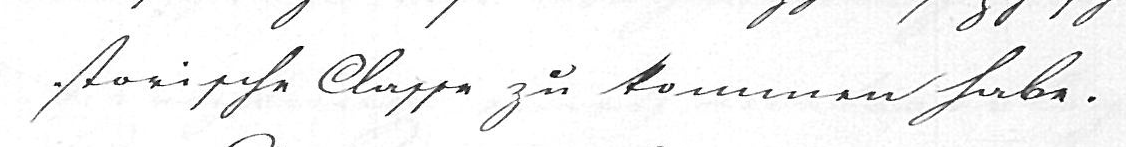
storische Classe zu kommen habe.
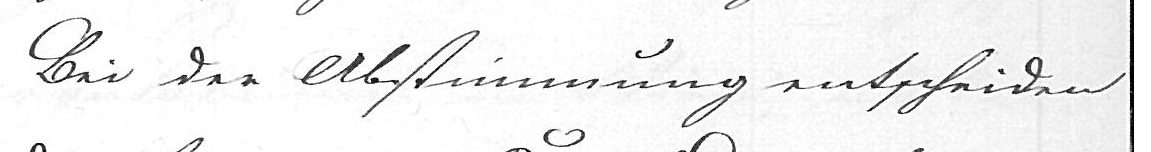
Bei der Abstimmung entscheiden
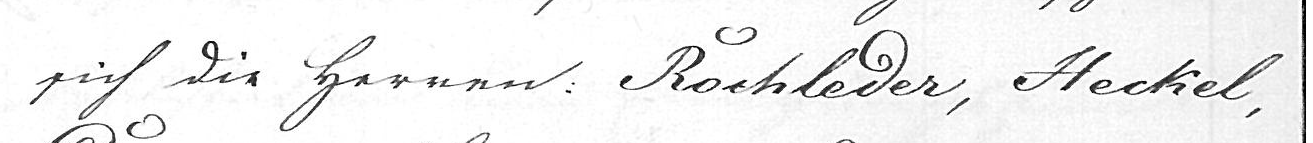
sich die Herren: Rochleder, Heckel,
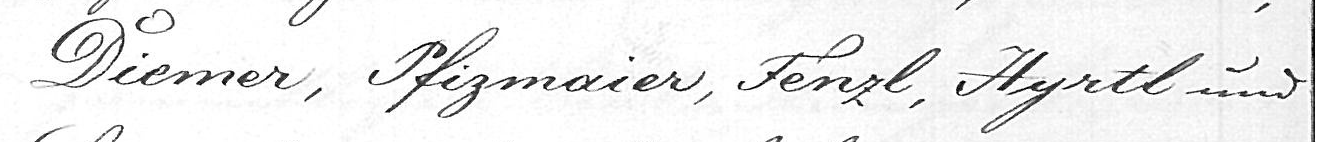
Diemer, Pfizmaier, Fenzl, Hyrtl und
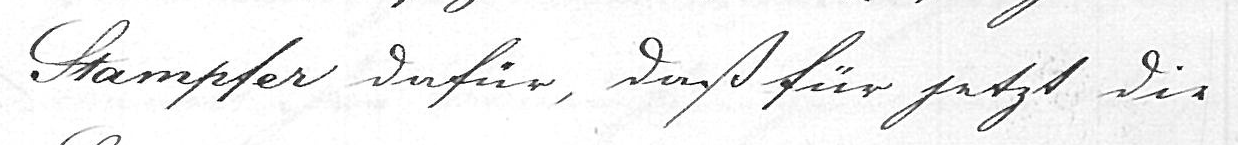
Stampfer dafür, daß für jetzt die
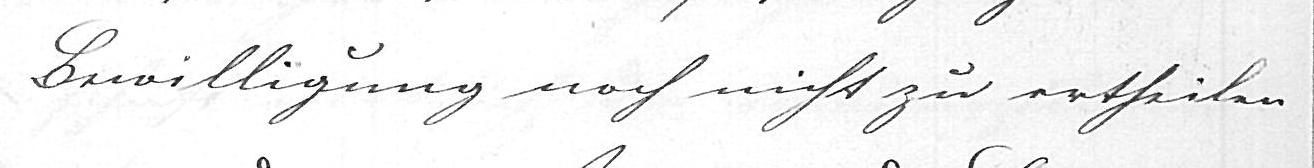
Bewilligung noch nicht zu ertheilen
